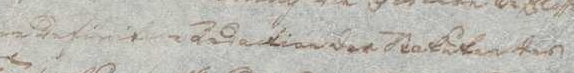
ne definitife Redaction der Statuten des
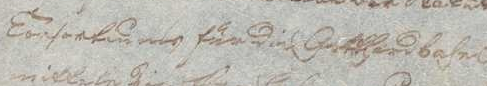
Consortiums für die Gotthardbahn
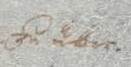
zu über-
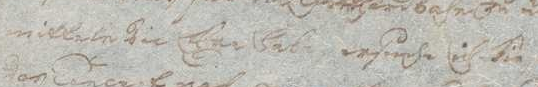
mitteln die Ehre habe, ersuche ich Sie,
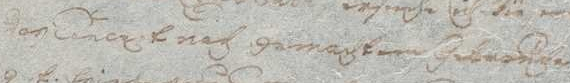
das Concept nach gemachtem Gebrauche
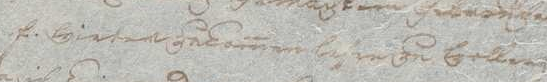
gef. wieder zukommen lassen zu wollen,
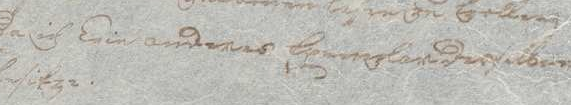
da ich kein anderes Exemplar desselben
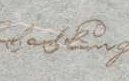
Hochachtung
